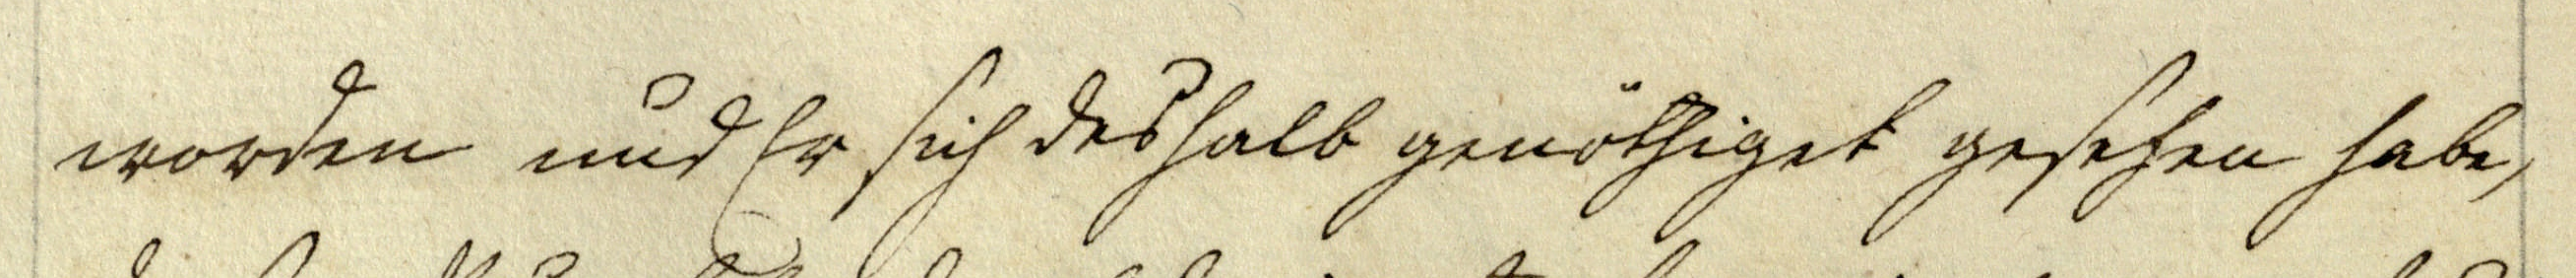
worden und Er sich deshalb genöthiget gesehen habe,
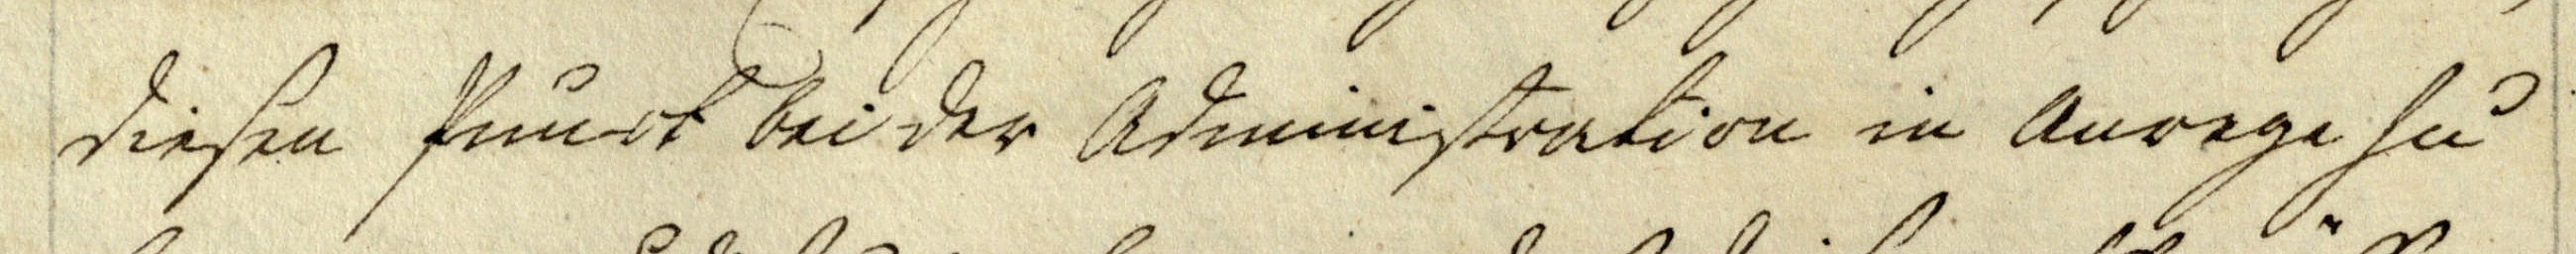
diesen Punct bei der Administration in Anrege zu
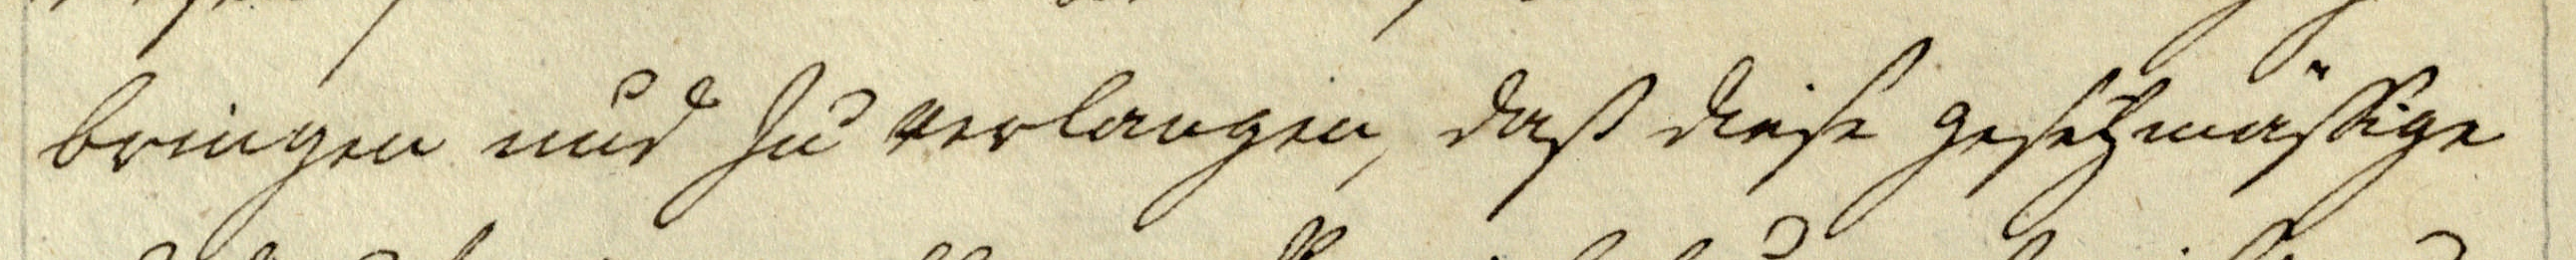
bringen und zu verlangen, daß diese gesetzmäßige
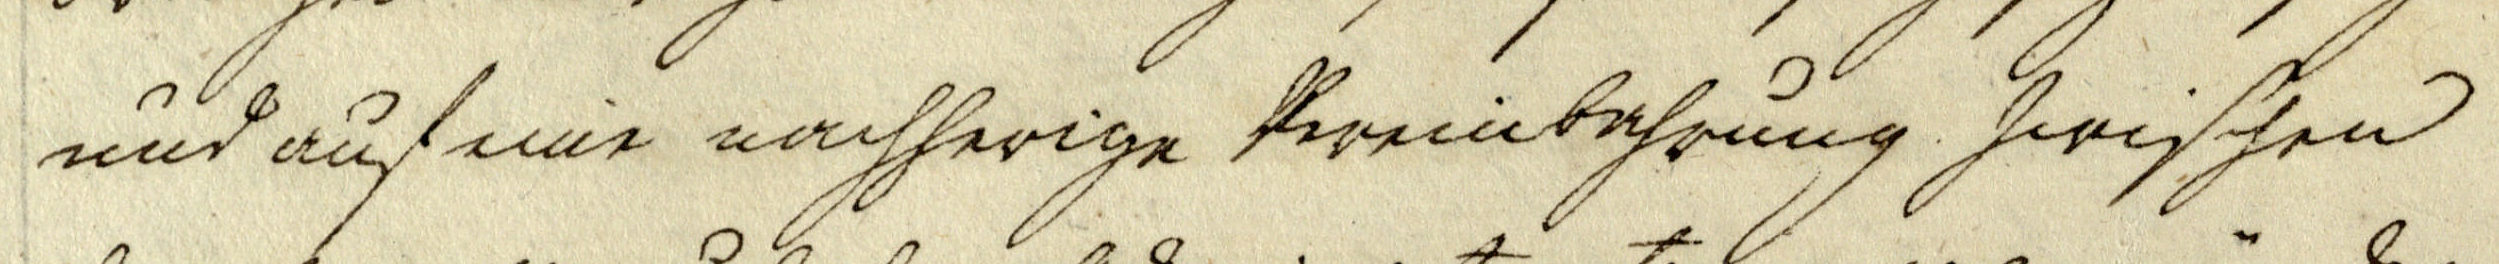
und auf eine nacherige Vereinbahrung zwischen
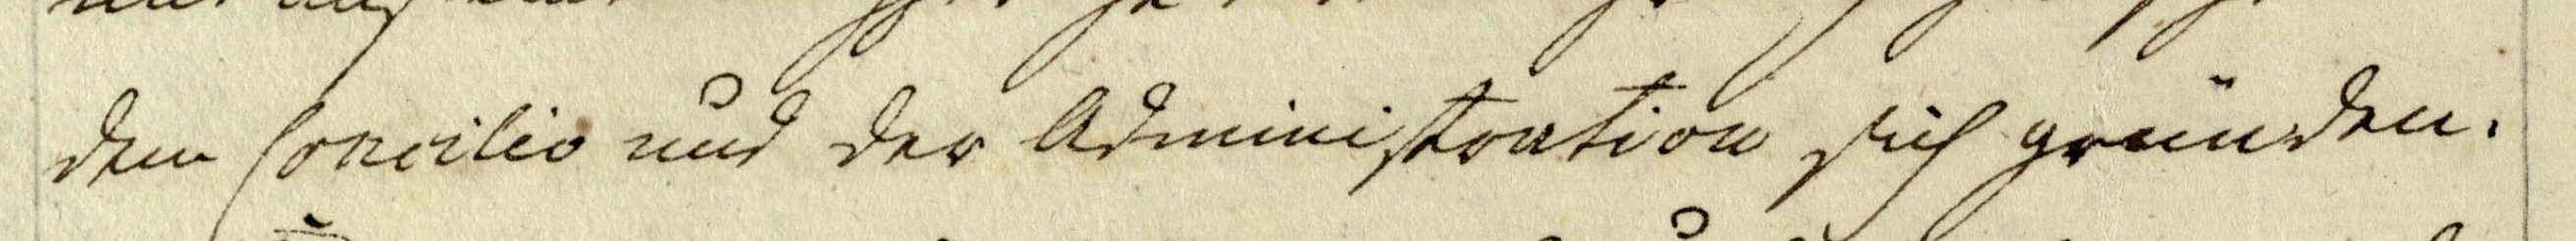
dem Concilio und der Administration sich gründen¬
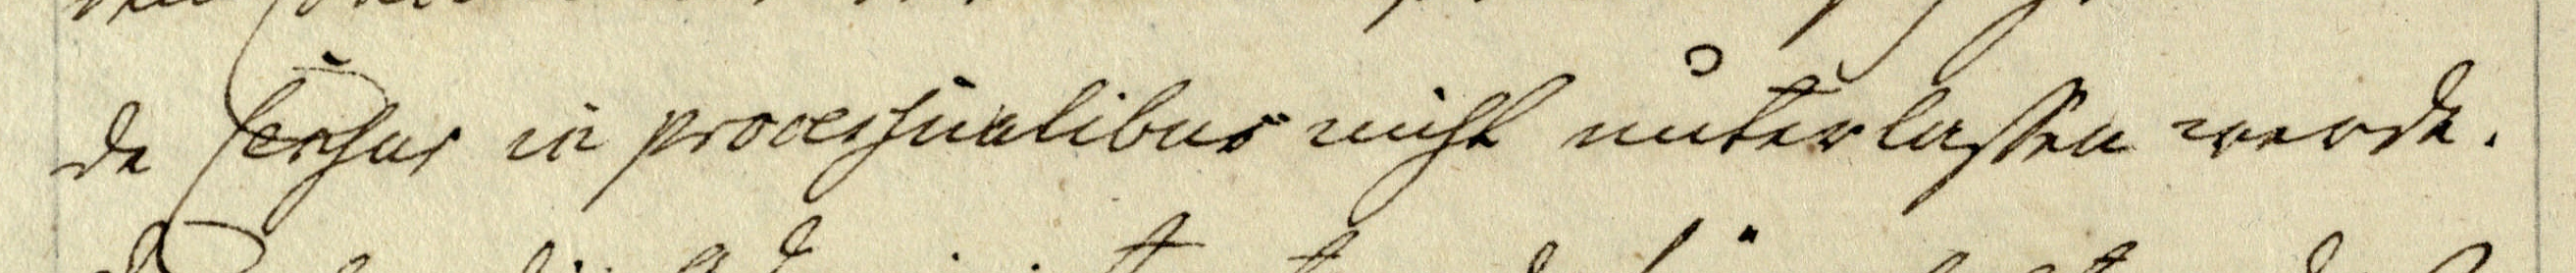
de Censur in processualibus nicht unterlassen werde.
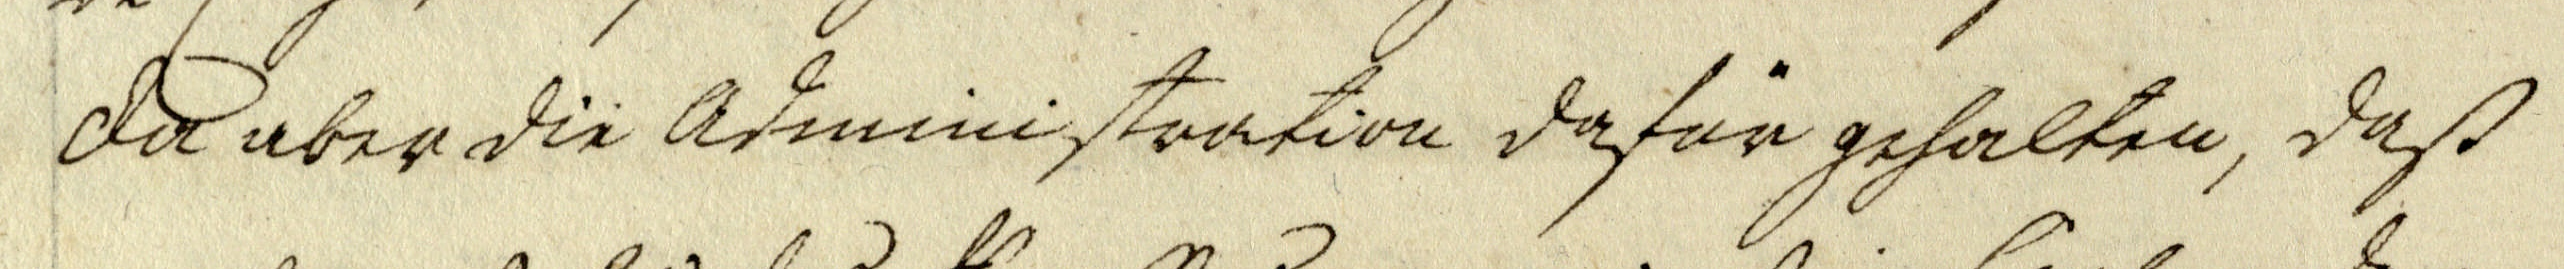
Da aber die Administration dafür gehalten, daß
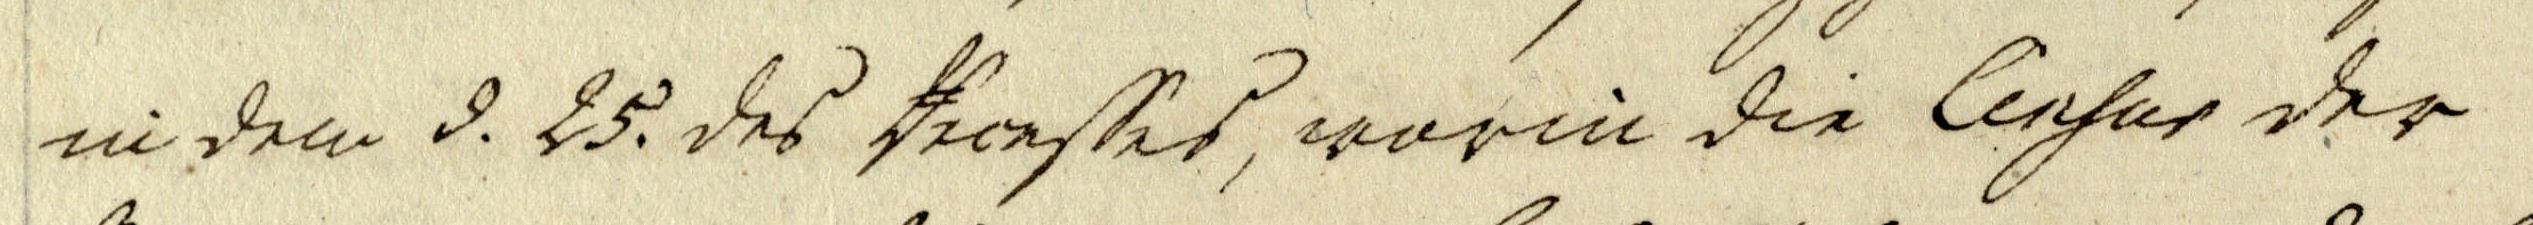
in dem §. 25. des Recesses, worin die Censur der
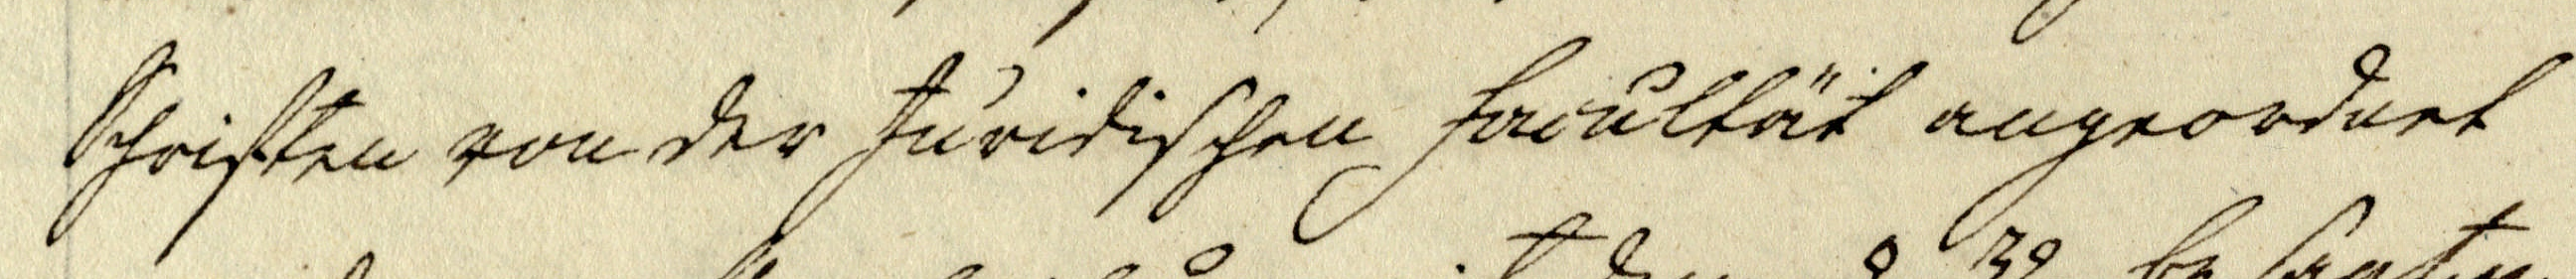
Schriften von der Juridischen Facultät angeordnet
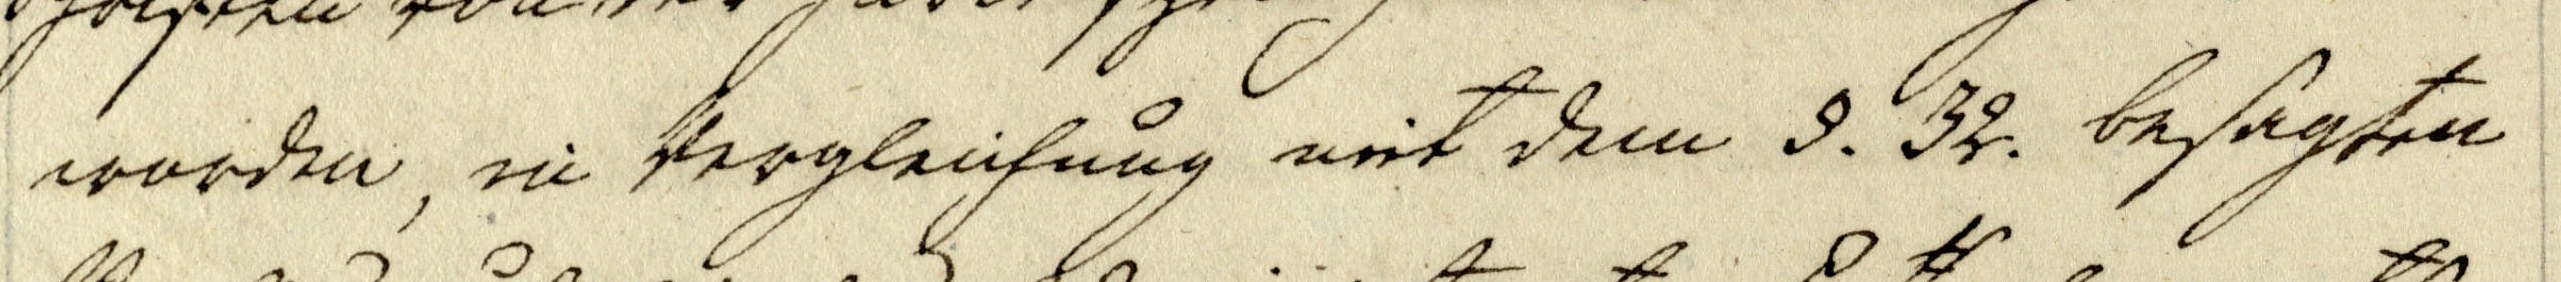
worden, in Vergleichung mit dem §. 32. besagten
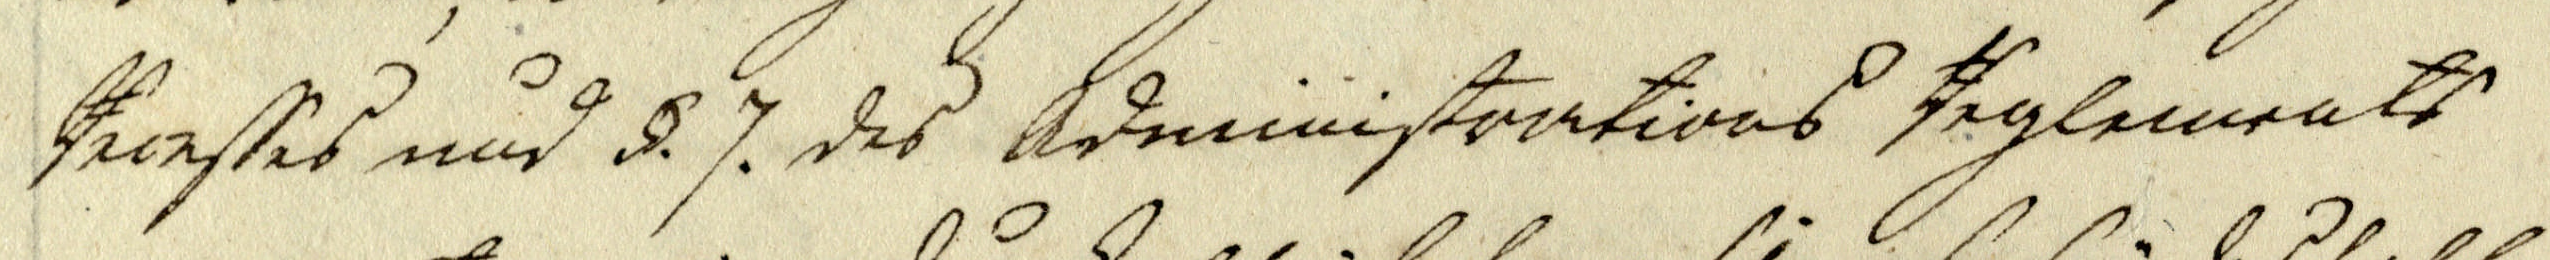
Recesses und §. 7. des Administrations Reglements
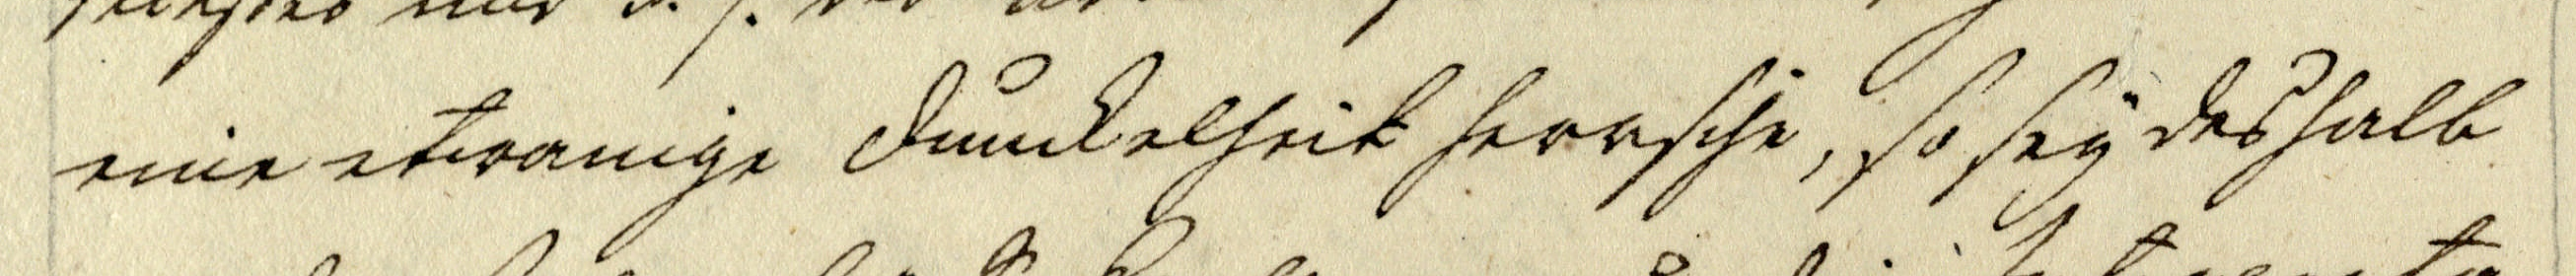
eine etwanige Dunckelheit herrsche, so seÿ deshalb
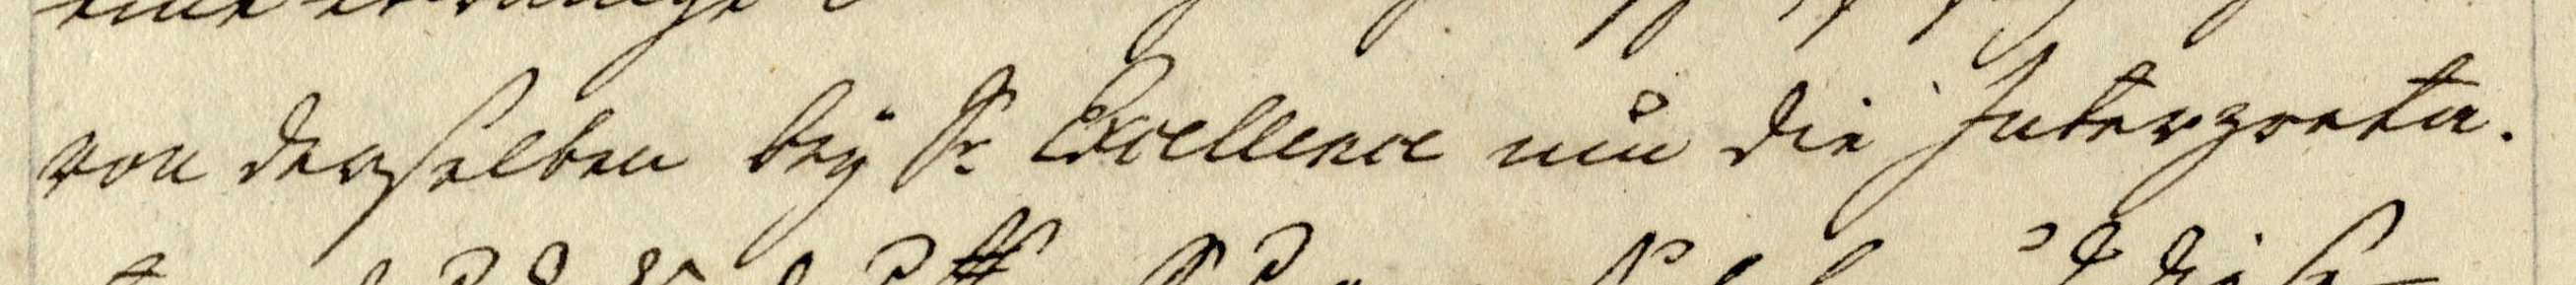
von derselben beÿ Sr Excellence um die Interpreta¬
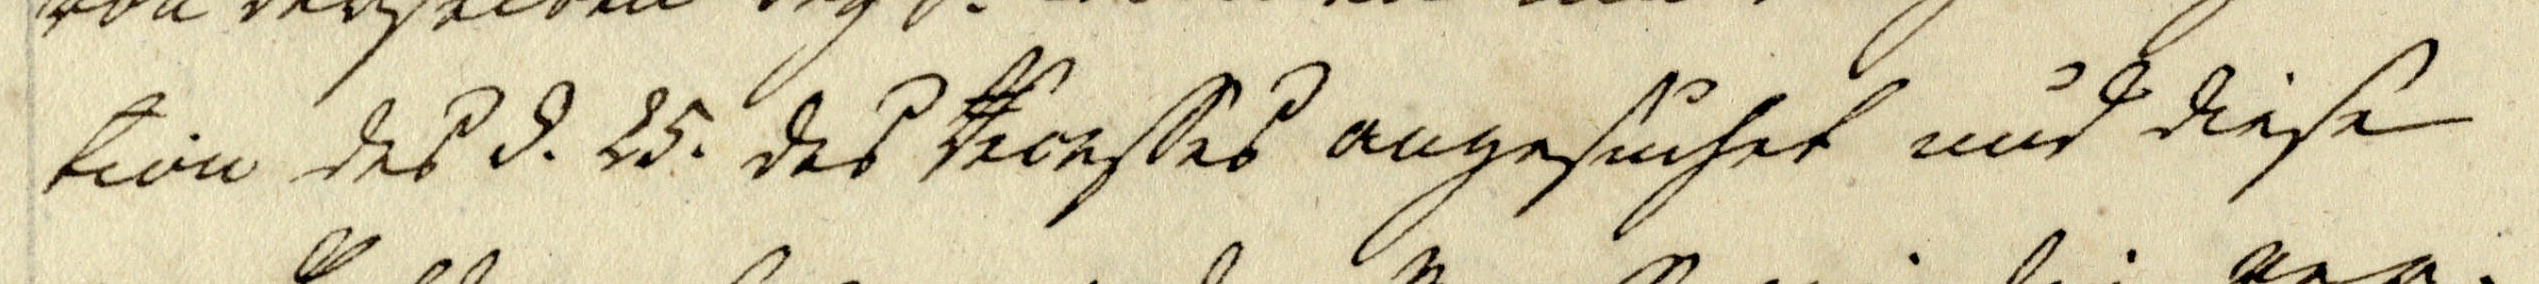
tion des §. 25. des Recesses angesuchet und diese
